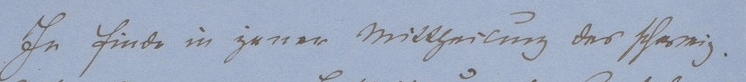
In finde in jener Mittheilung des schweiz.
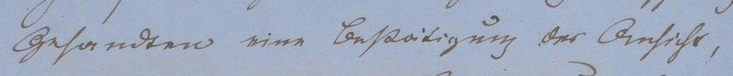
Gesandten eine Bestätigung der Ansicht,
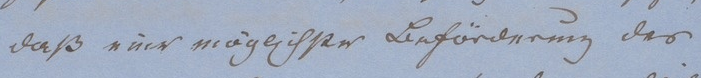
daß eine möglichst Beförderung des
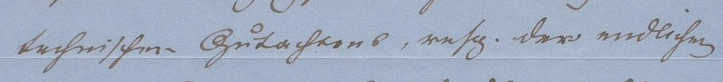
technischen Gutachtens, resp. der endlichen
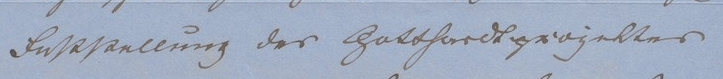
Feststellung des Gotthardtprojektes
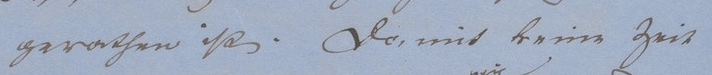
gerathen ist. Damit keine Zeit
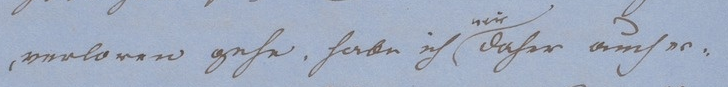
verloren gehe, habe ich mir daher auch er-
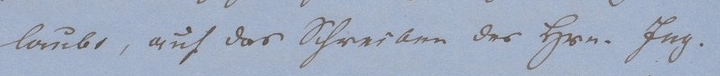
laubt, auf das Schreiben des Hrn. Ing.
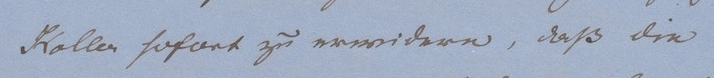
Koller sofort zu erwidern, daß die
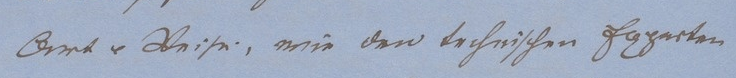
Art & Weise, wie den technischen Experten
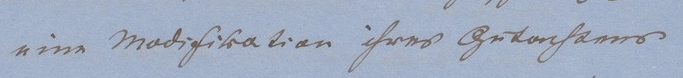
eine Modifikation ihres Gutachtens
